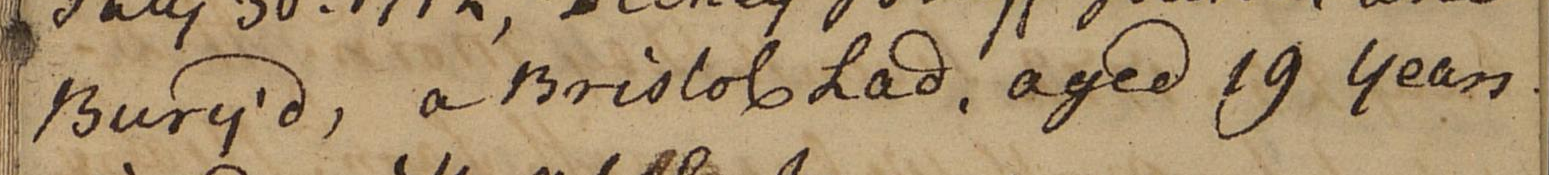Bury'd, a Bristol Lad, aged 19 years
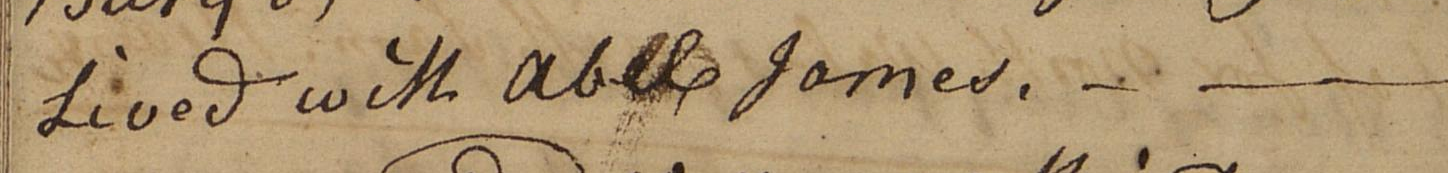Lived with Abel James.-
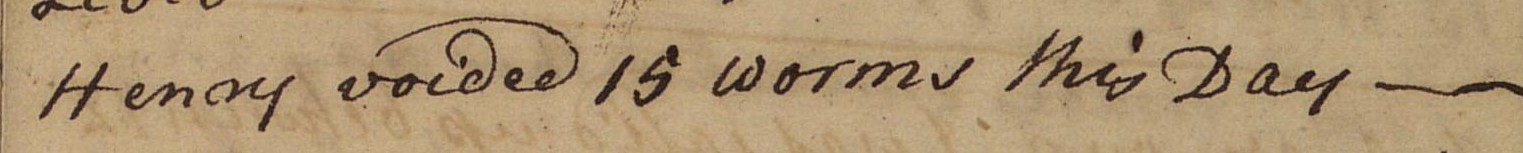Henry voided 15 worms this Day-
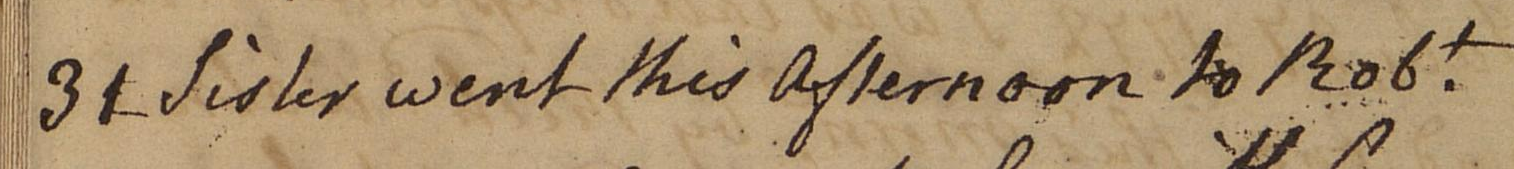31 Sister went this afternoon to Rob^t.
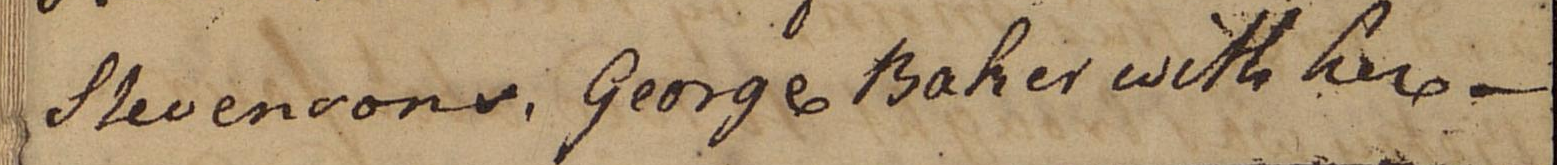Stevenvons, George Baker with her-
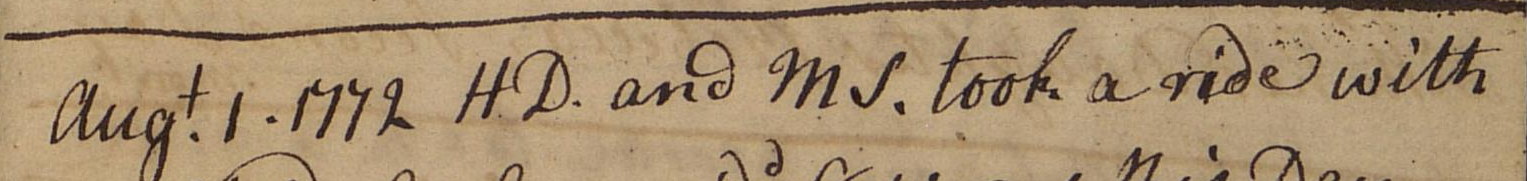Aug^t. 1. 1772 HD. and MS. took a ride with
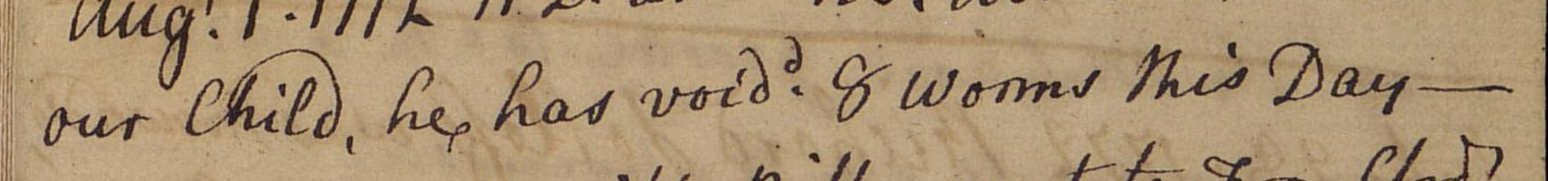our child, he has void^d. 8 worms this Day-
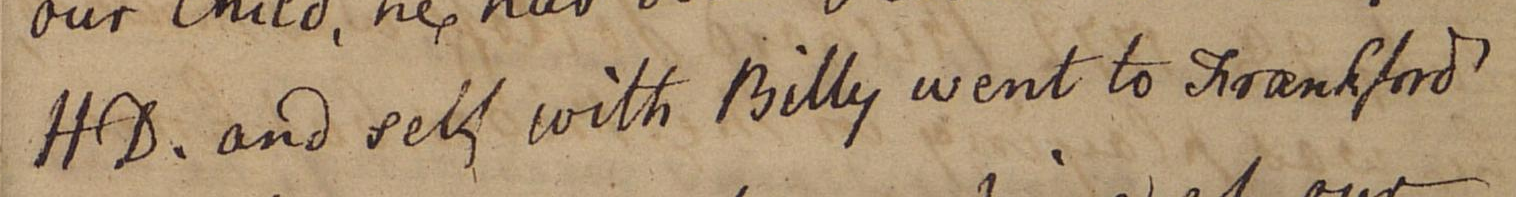HD. and self with Billy went to Frankford
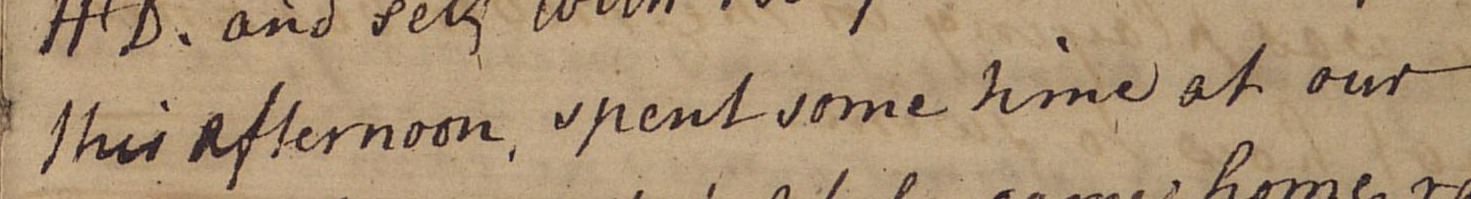this afternoon, spent some time at our
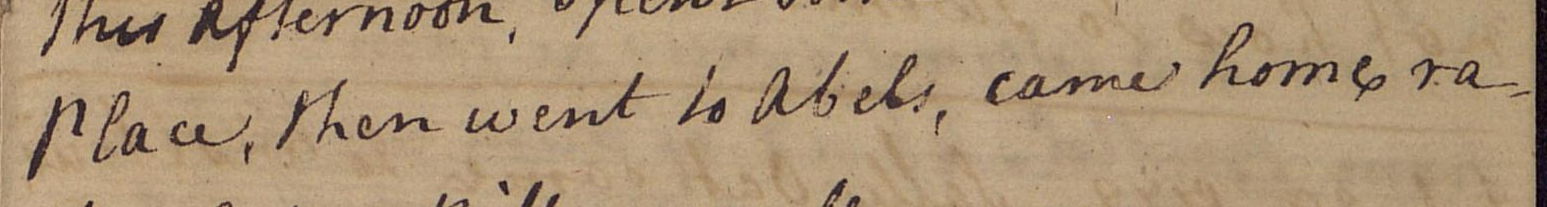Place, then went to Abels, came home ra-
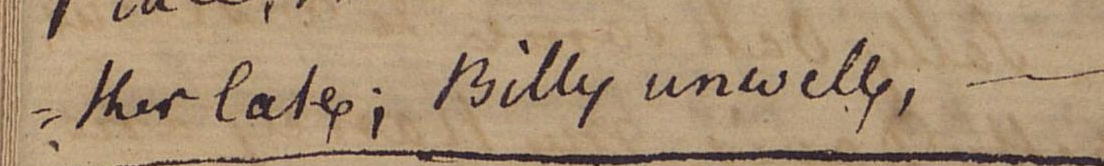-ther late; Billy unwell,-
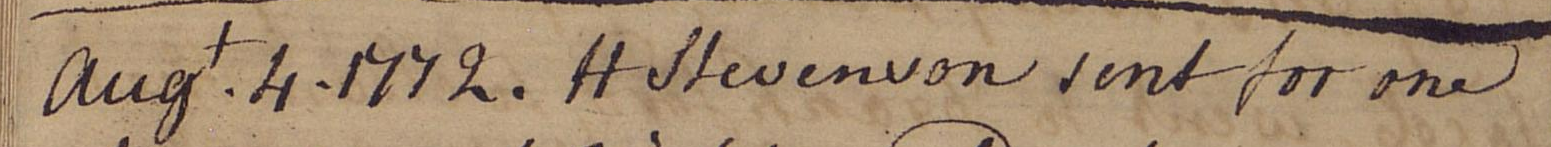Aug^t. 4 1772. H Stevenson sent for one
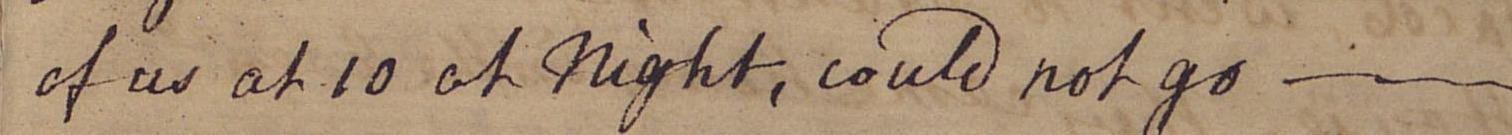of us at 10 at Night, could not go-
